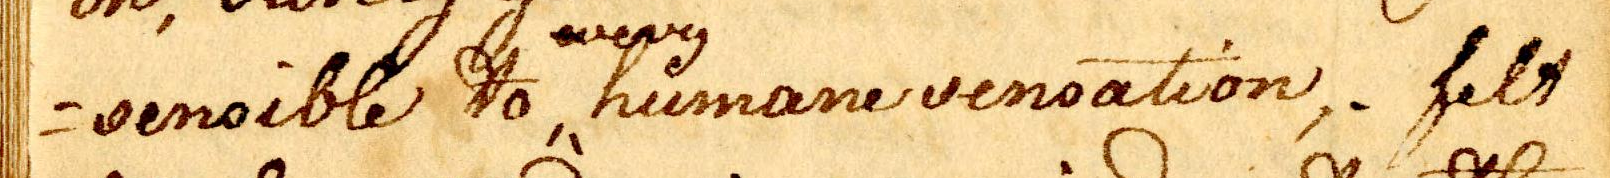-sensible to humane sensation, felt
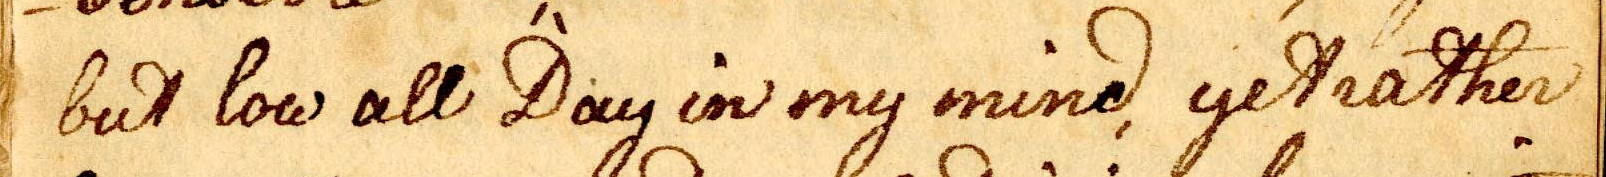but low all Day in my mind yet rather
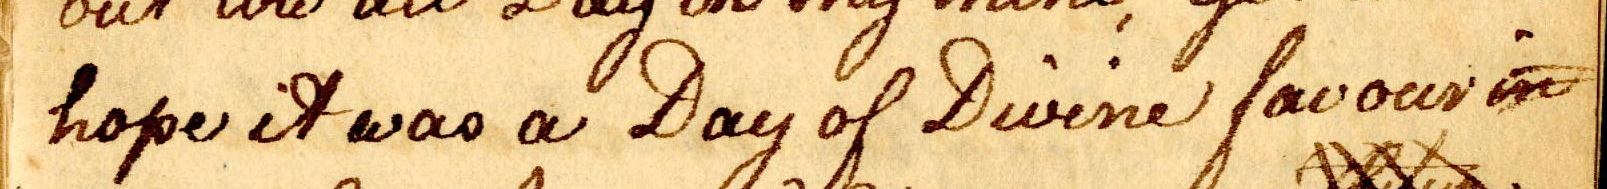hope it was a Day of Divine favour in
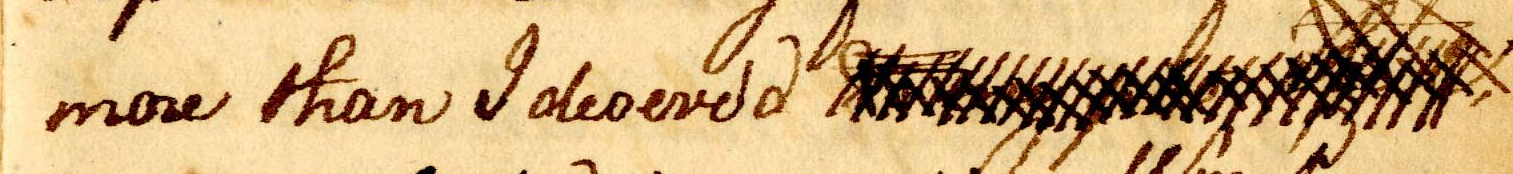more than I deservd [Hetty ____ _____]
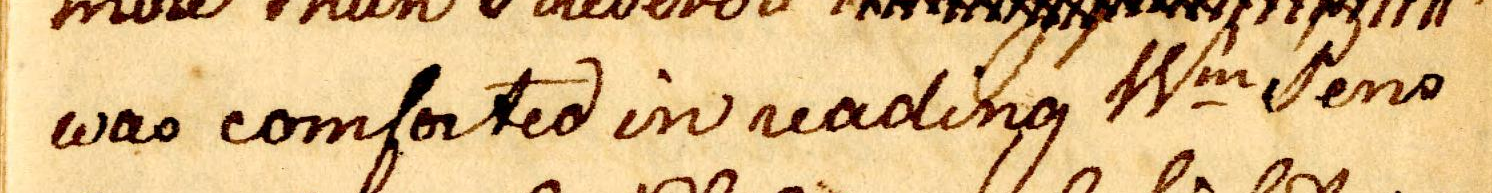was comforted in reading W^m Pens
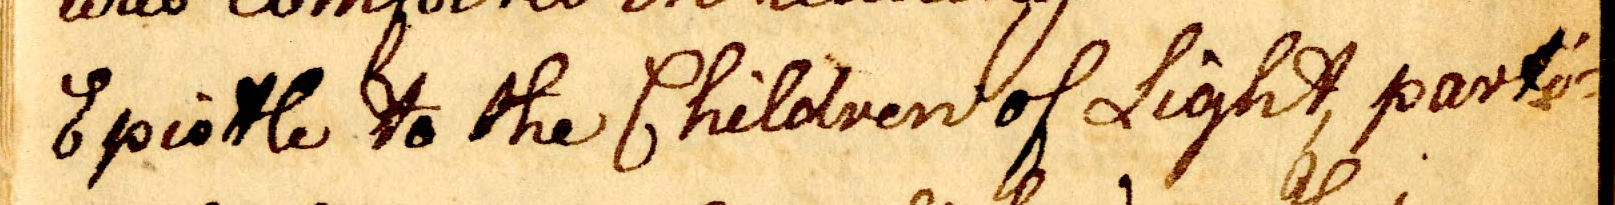Epistle to the Children of Light, parti-
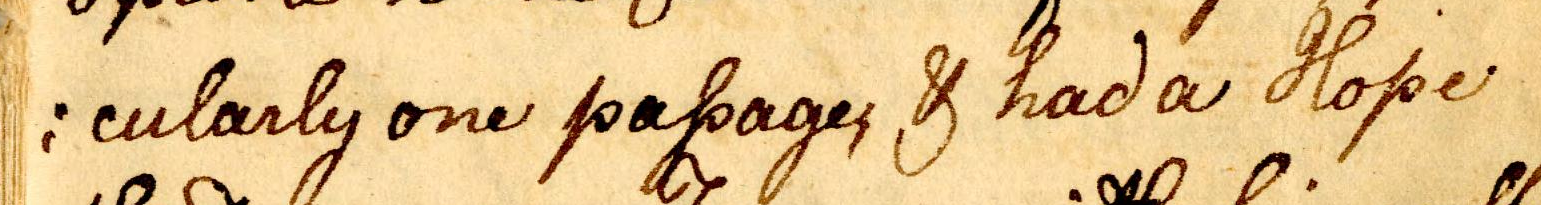-cularly one passage & had a Hope
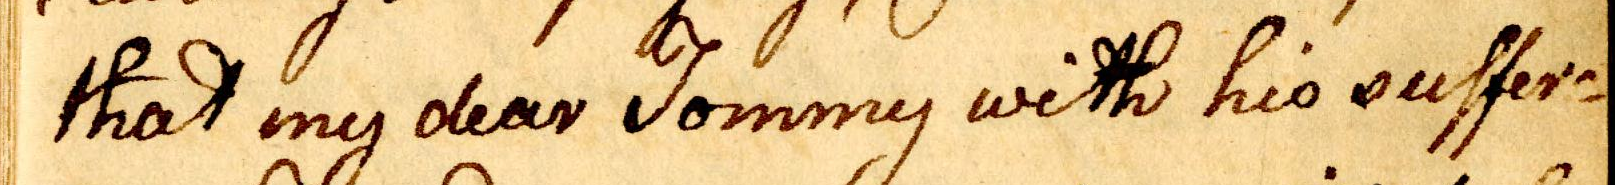that my dear Tommy with his suffer-
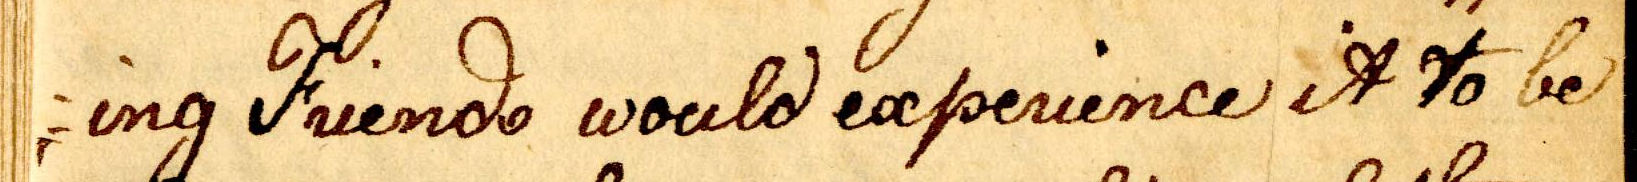-ing Friends would experience it to be
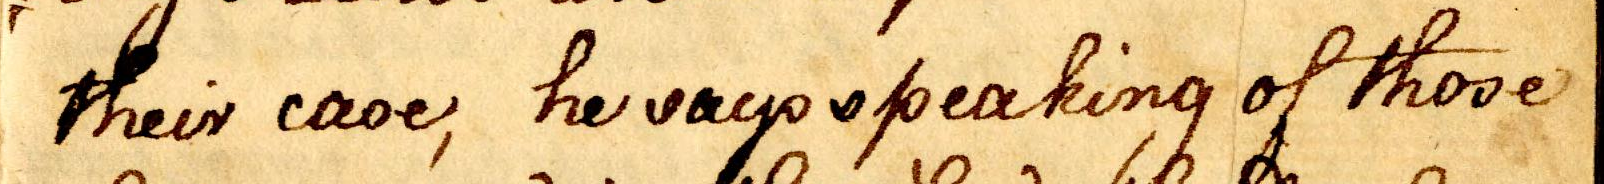their case, he says speaking of those
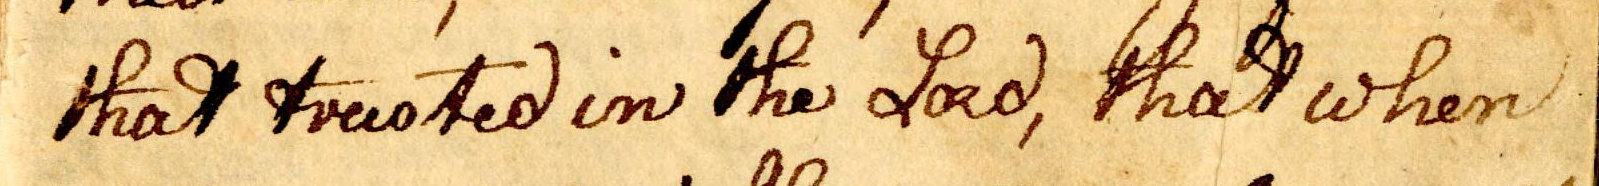that trusted in the Lord, that when
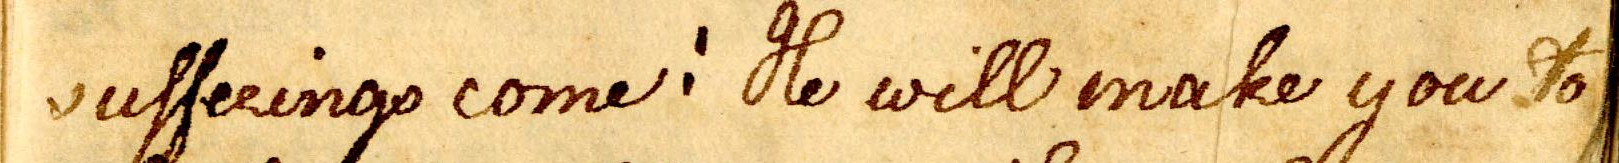sufferings come: He will make you to
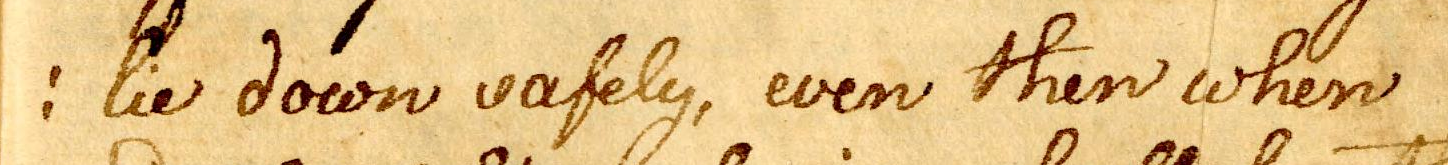"lie down safely, even then when
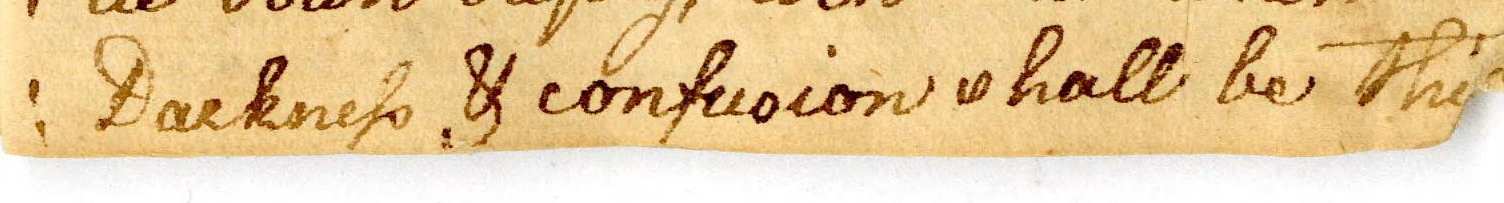"Darkness & confusion shall be the
